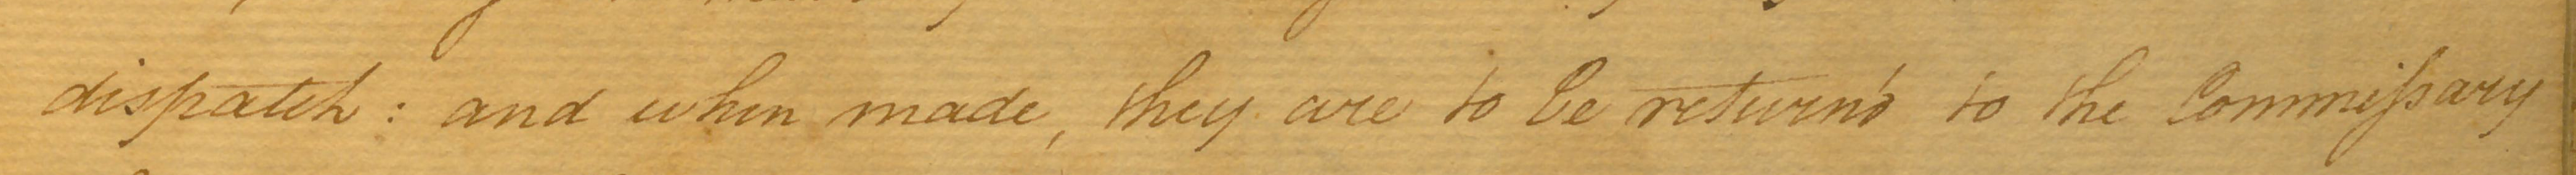dispatch: and when made, they are to be return'd to the Commissary
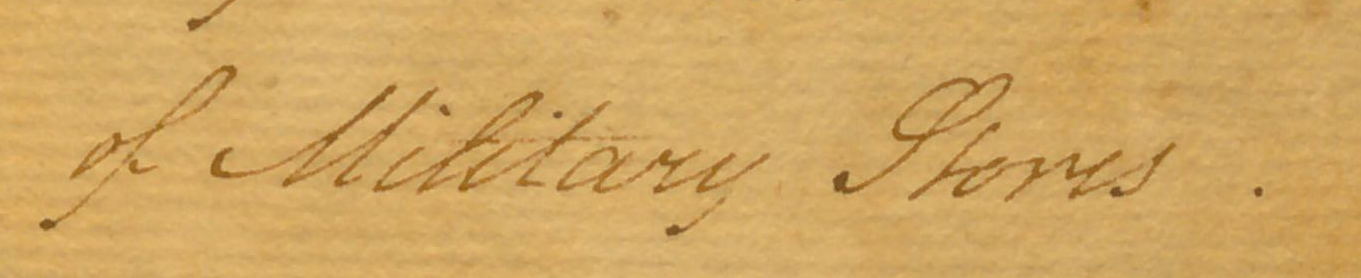of Military Stores.
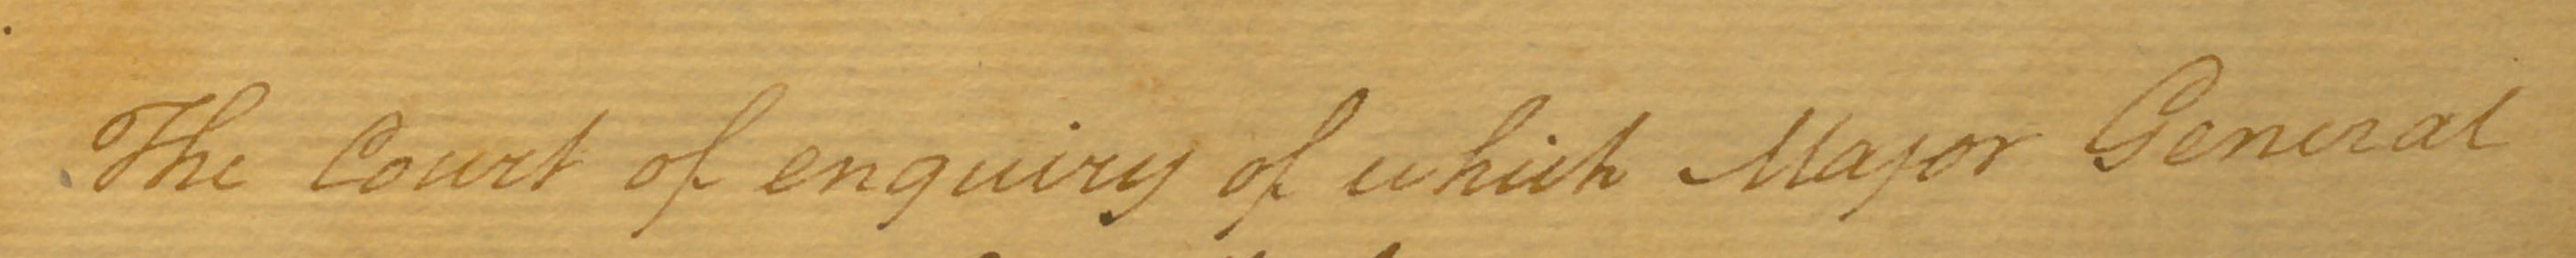The Court of enquiry of which Major General
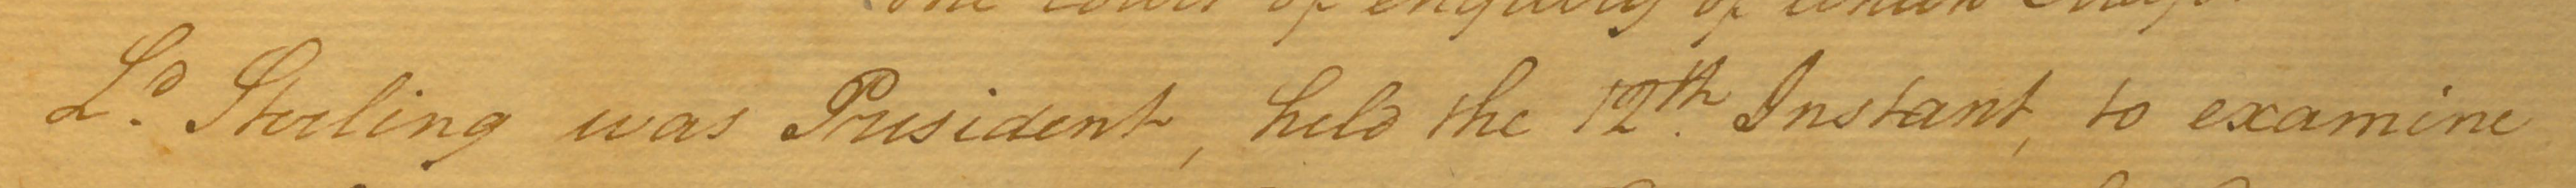L^d. Sterling was President, held the 12^th. Instant, to examine
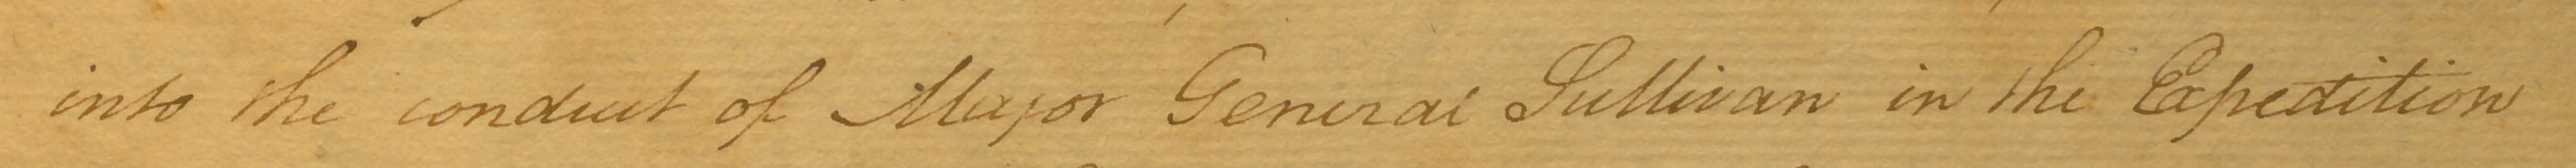into the conduct of Major General Sullivan in the Expedition
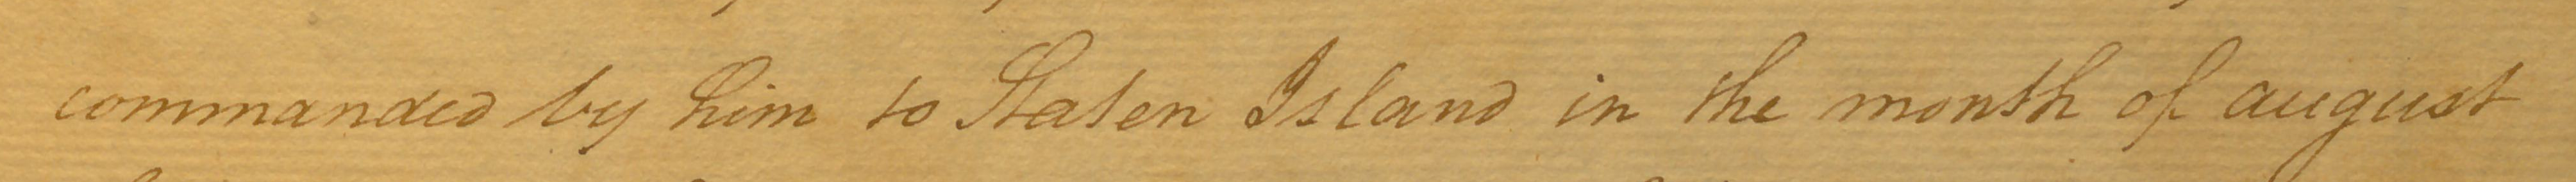commanded by him to Staten Island in the month of august
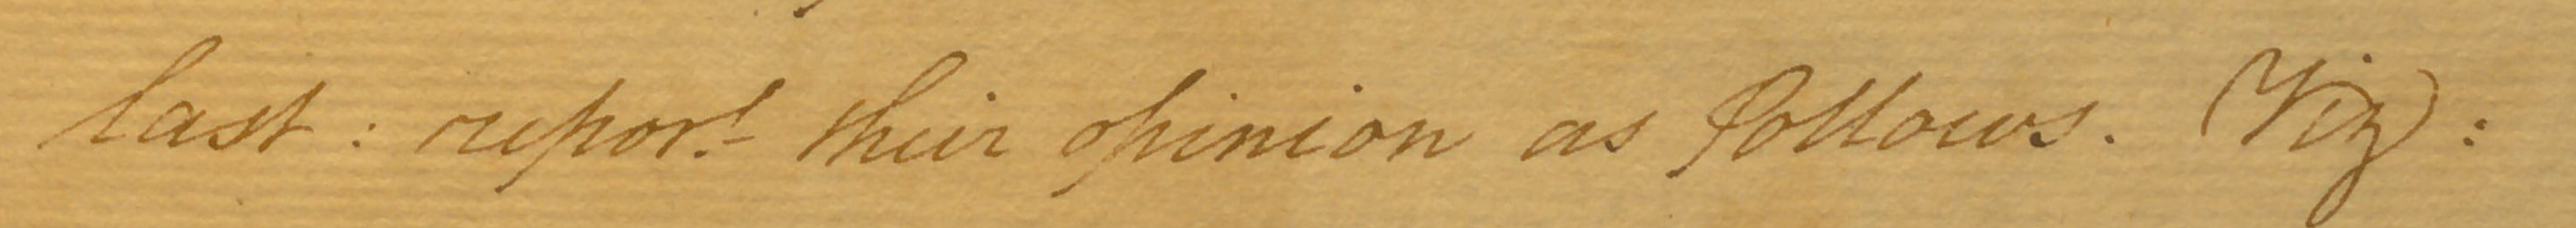last: repor^t. their opinion as follows. Viz:
